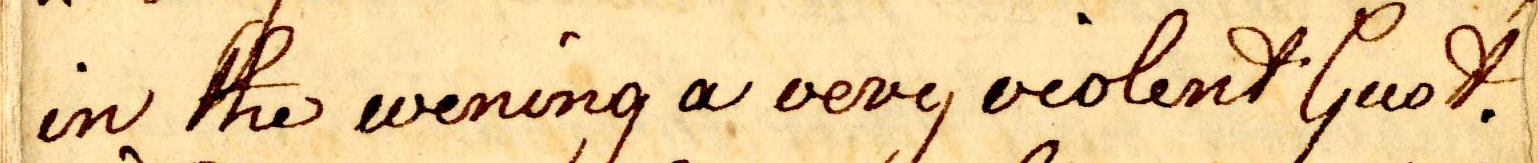in the evening a very violent Gust.
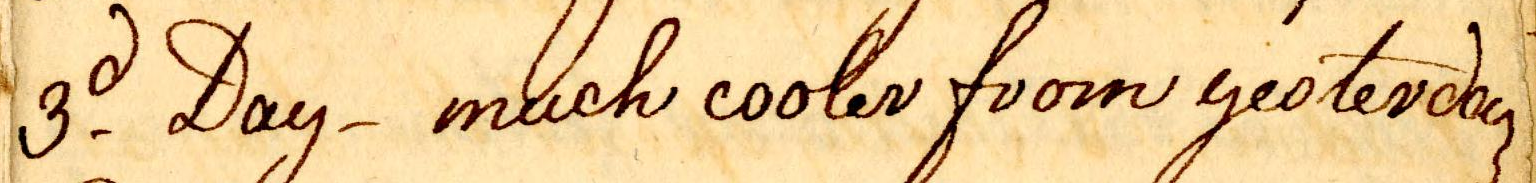3^d. Day- much cooler from yesterday
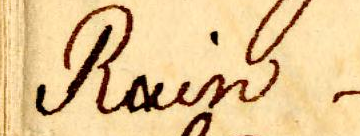Rain
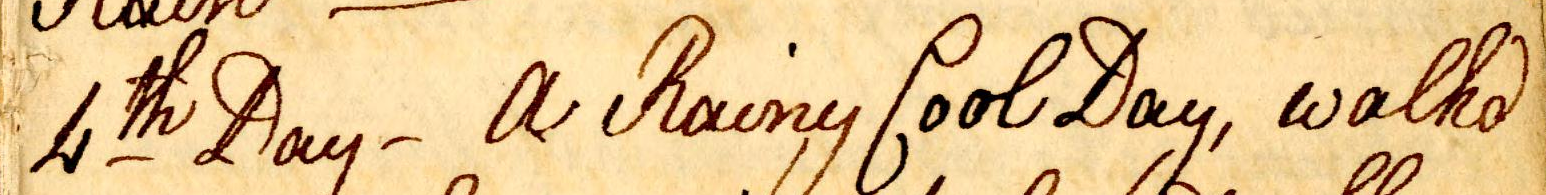4^th Day- A Rainy Cool Day, walkd
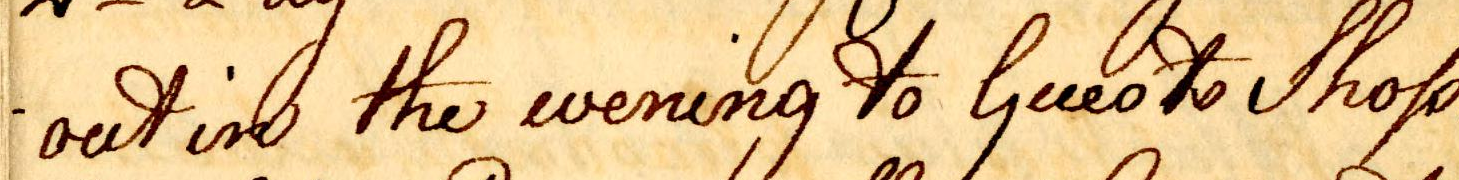out in the evening to Guests Shop.
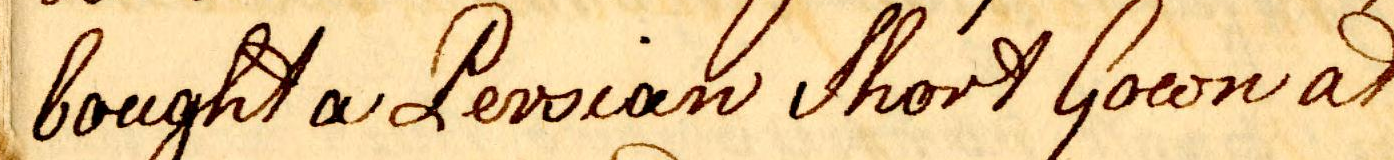bought a Persian Short Gown at
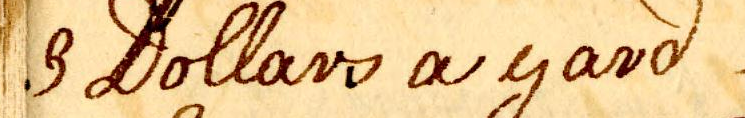3 Dollars a yard
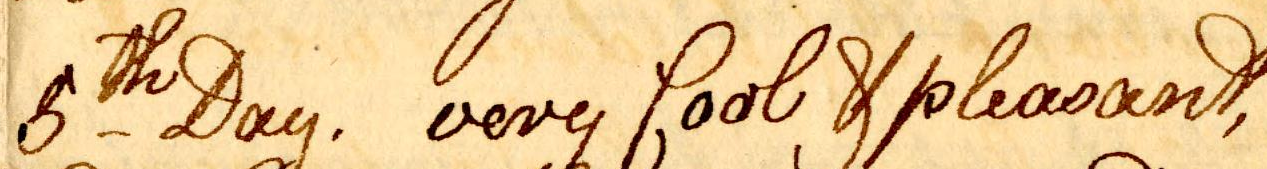5^th Day. very Cool & pleasant
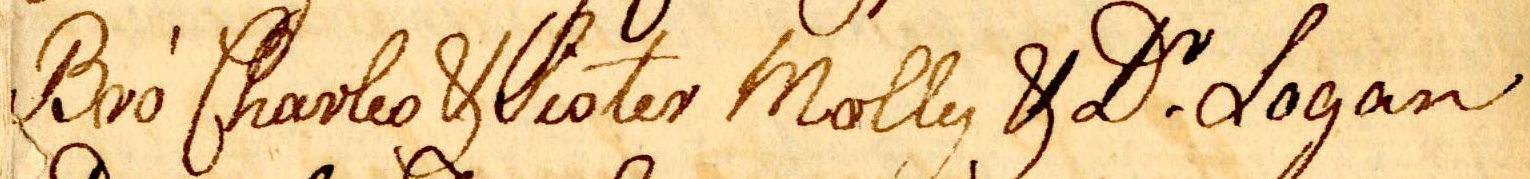Bro' Charles & Sister Molly & D^r. Logan
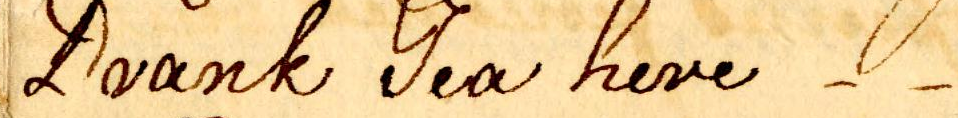Drank Tea here
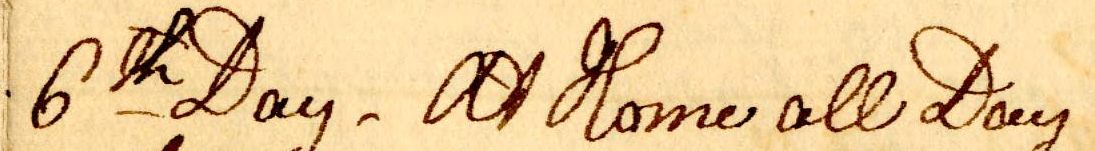6^th Day- At Home all Day
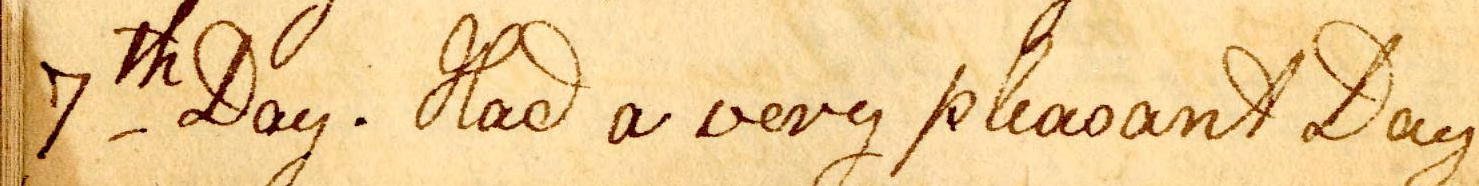7^th Day. Had a very pleasant Day
